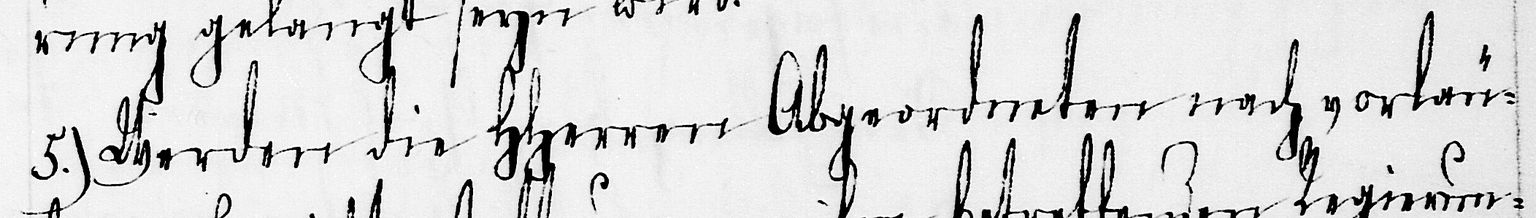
5.) Werden die HHerren Abgeordneten nach vorläu¬
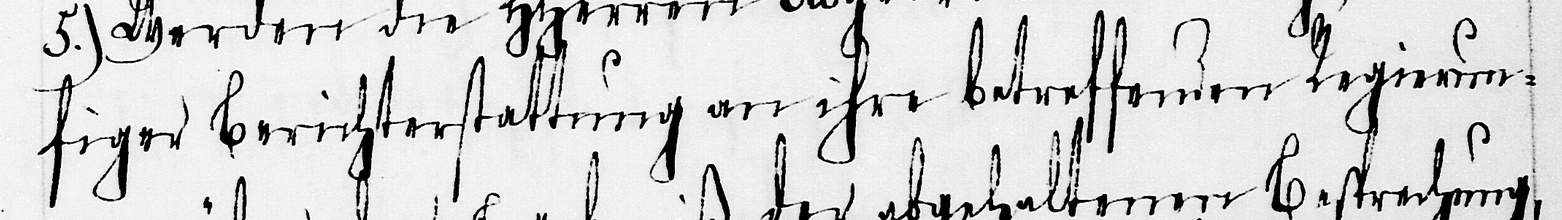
figer Berichterstattung an ihre betreffenden Regierun¬
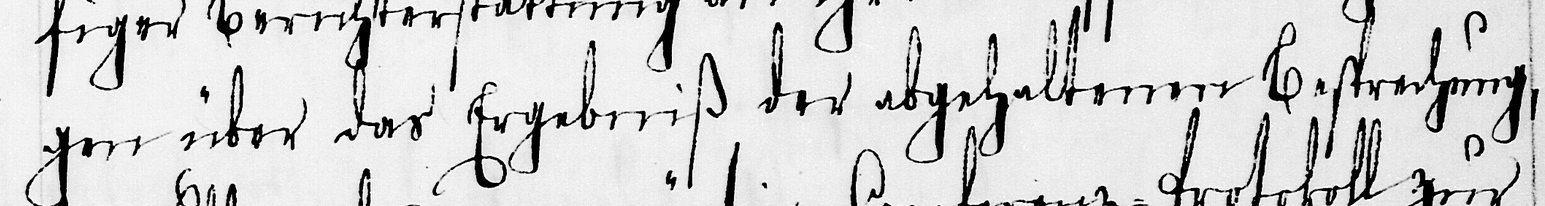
gen über das Ergebniß der abgehaltenen Besprechung,
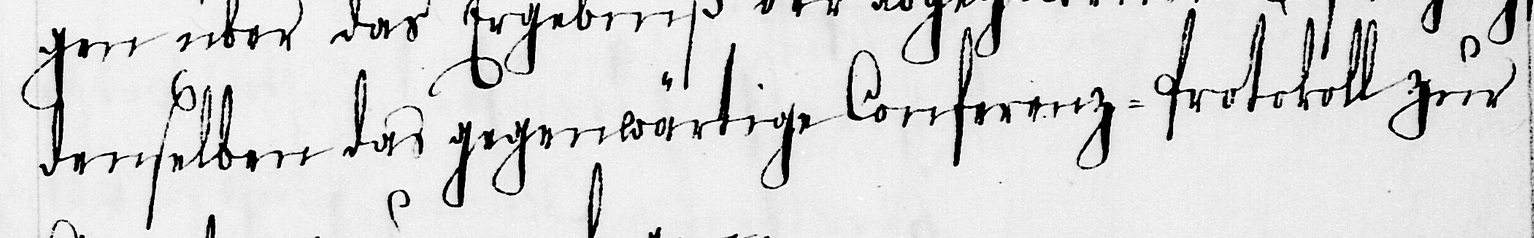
denselben das gegenwärtige Conferenz-Protokoll zur
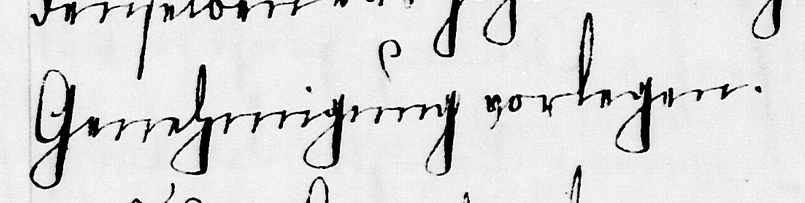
Genehmigung vorlegen.
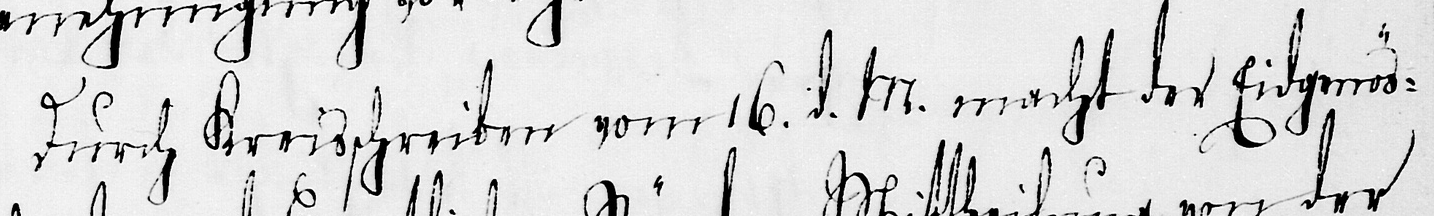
Durch Kreisschreiben vom 16. d. M. macht der Eidgenöß¬
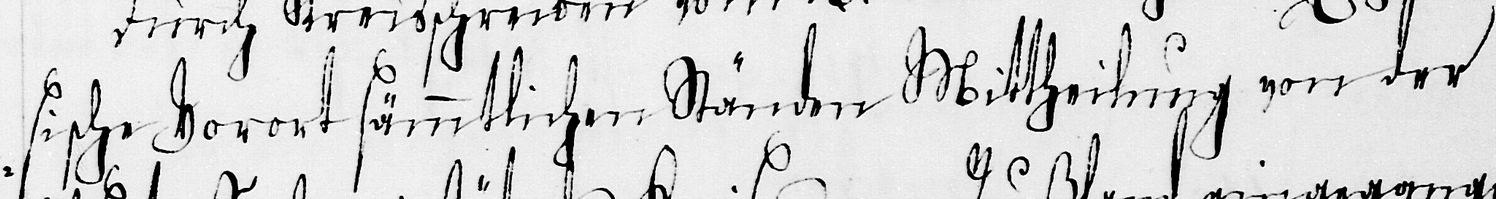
ische Vorort sämmtlichen Ständen Mittheilung von der
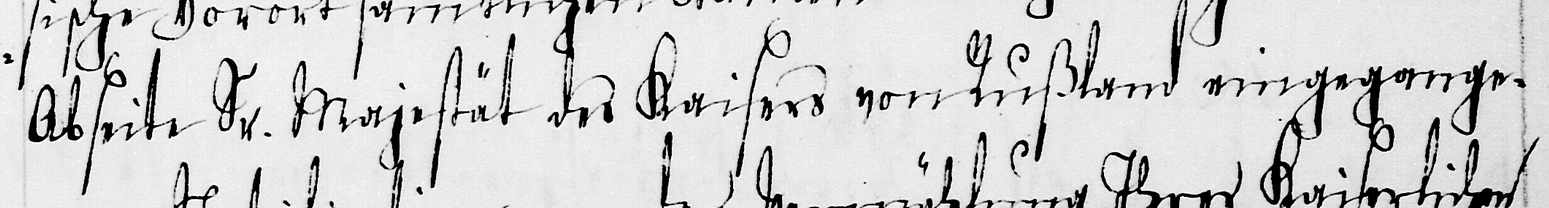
Abseite Sr. Majestät des Kaisers von Rußland eingegange¬
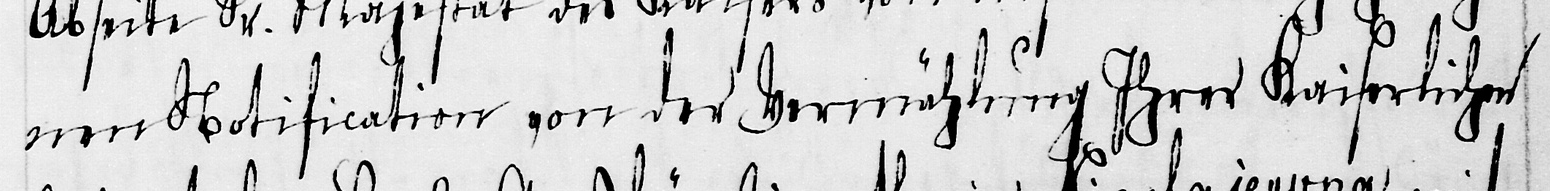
nen Notification von der Vermählung Ihrer Kaiserlichen
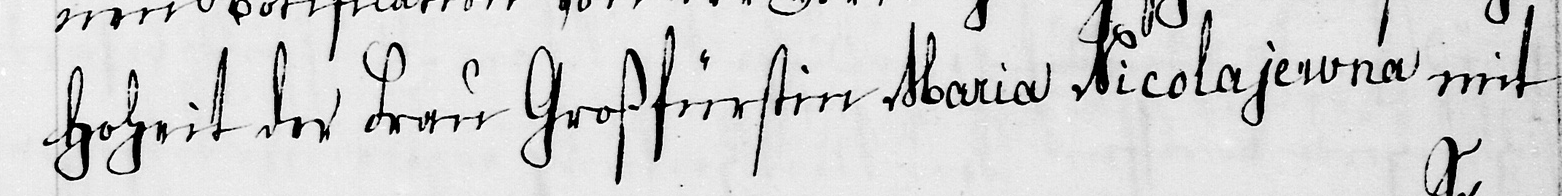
Hoheit der Frau Großfürstin Maria Nicolajewna mit
